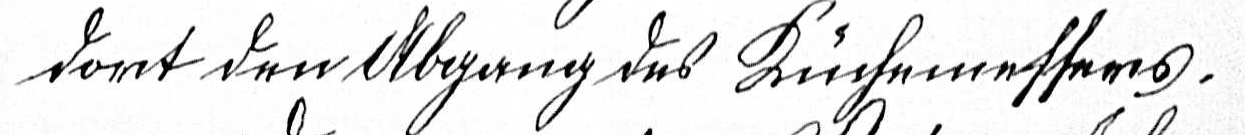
dort den Abgang des Küchenmessers.
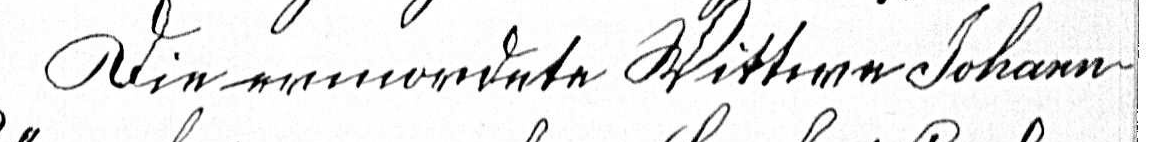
Die ermordete Wittwe Johann
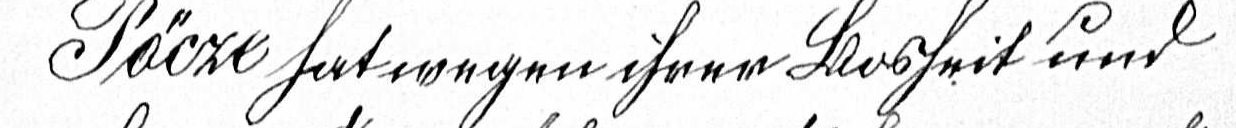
Pöcze hat wegen ihrer Bosheit und
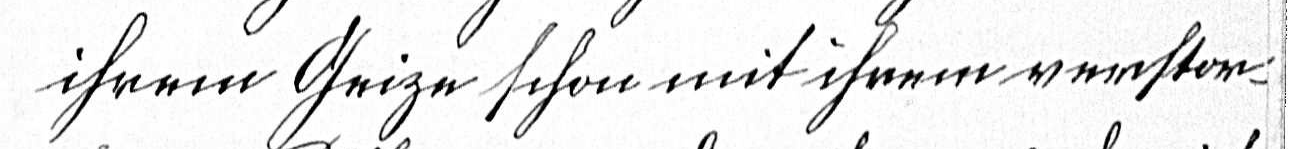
ihrem Geize schon mit ihrem verstor¬
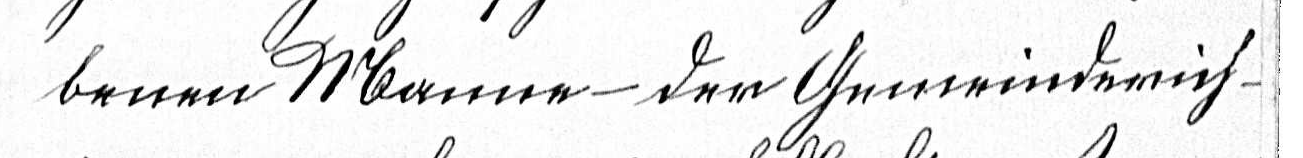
benen Manne – der Gemenderich¬
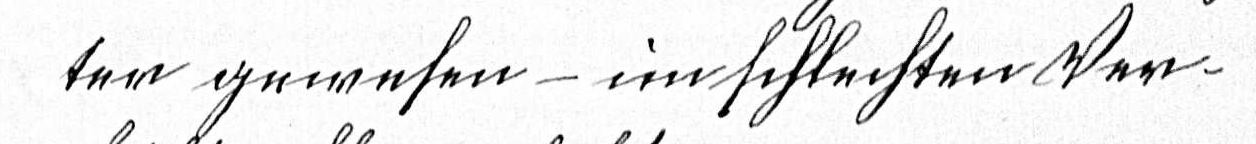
ter gewesen – im schlechten Ver¬
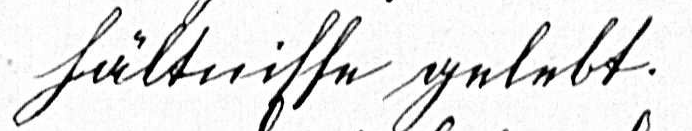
hältnisse gelebt.
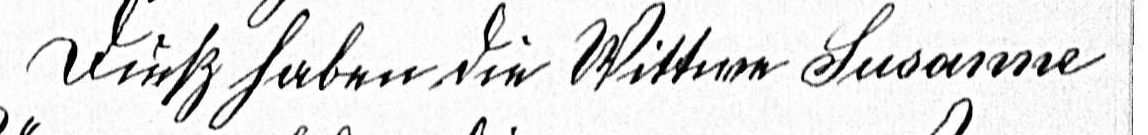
Dieß haben die Wittwe Susanne
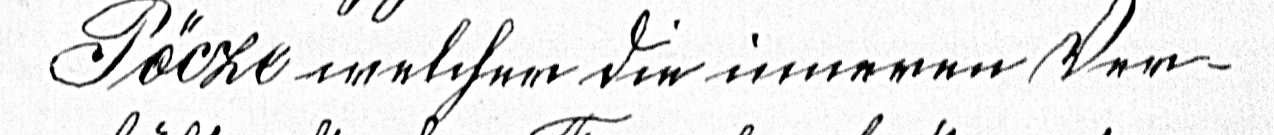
Pöcze welcher die inneren Ver¬
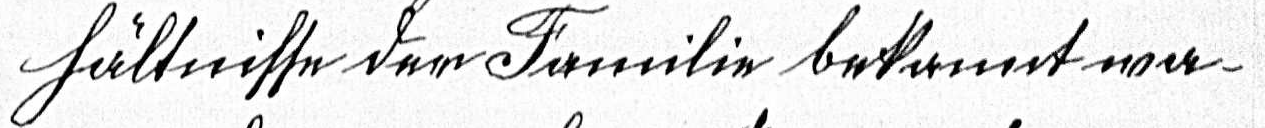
hältnisse der Familie bekannt wa¬
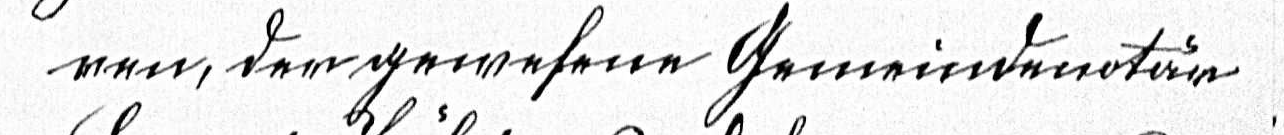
ren, der gewesene Gemeindenotär
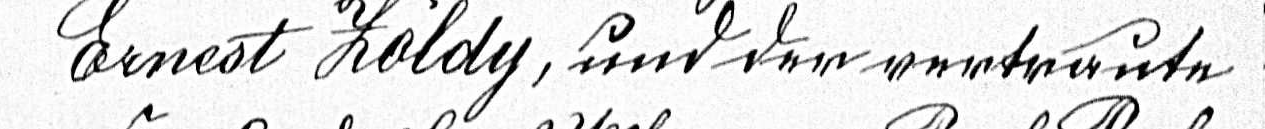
Ernest Zöldy, und der vertraute
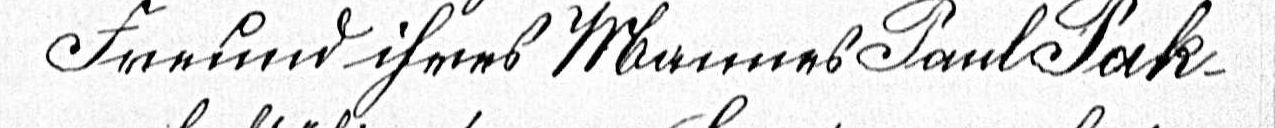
Freund ihres Mannes Paul Pak¬
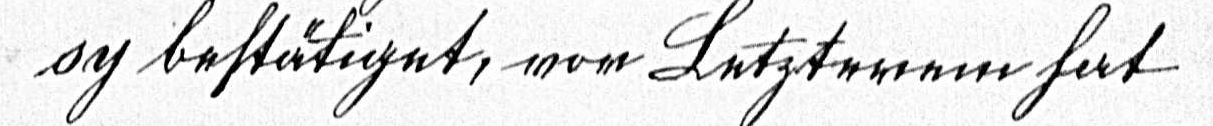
sy bestätiget, vor Letzterem hat
